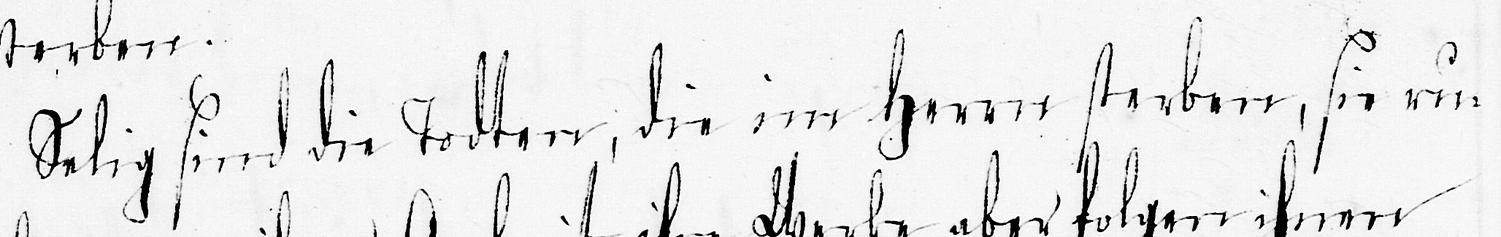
Selig sind die Todten, die im Herrn sterben, sie ru¬
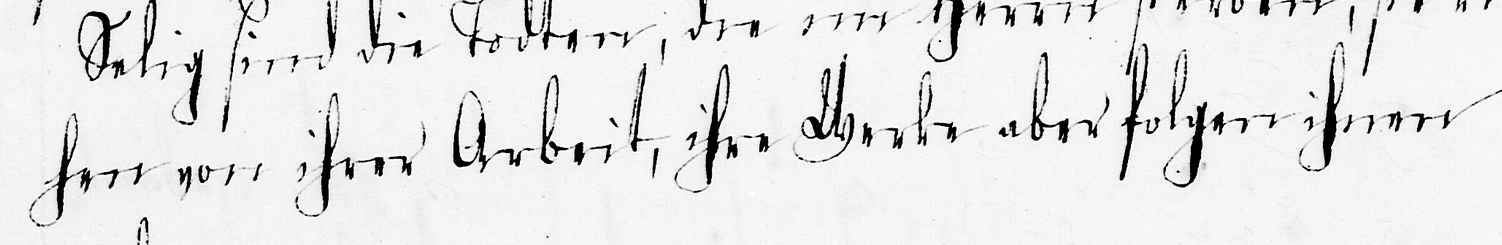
hen von ihrer Arbeit, ihre Werke aber folgen ihnen
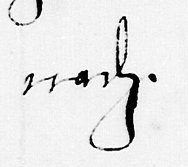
nach.
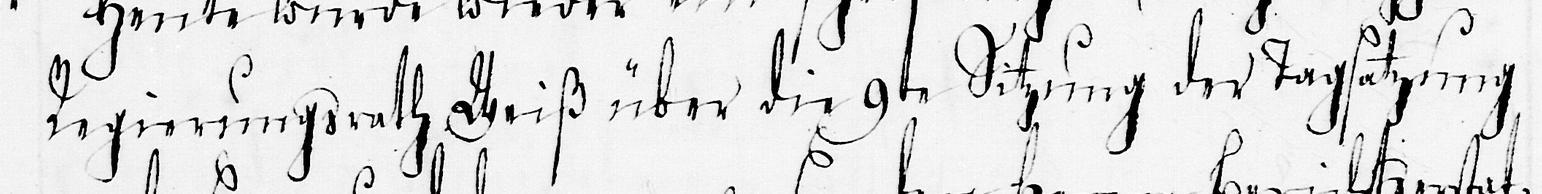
Regierungsrath Weiß über die 9te Sitzung der Tagsatzung
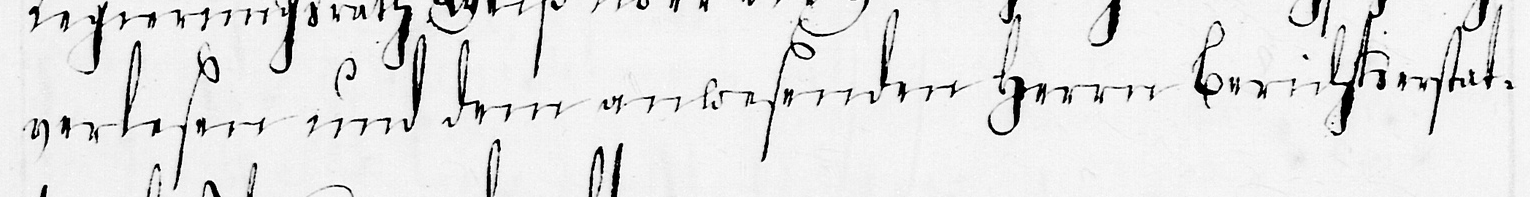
verlesen und dem anwesenden Herrn Berichtserstat¬
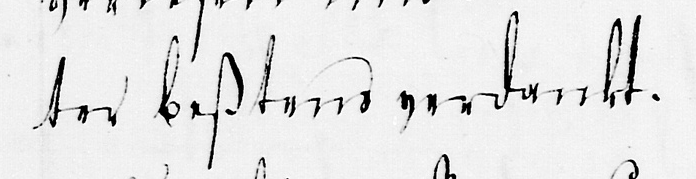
ter beßtens verdankt.
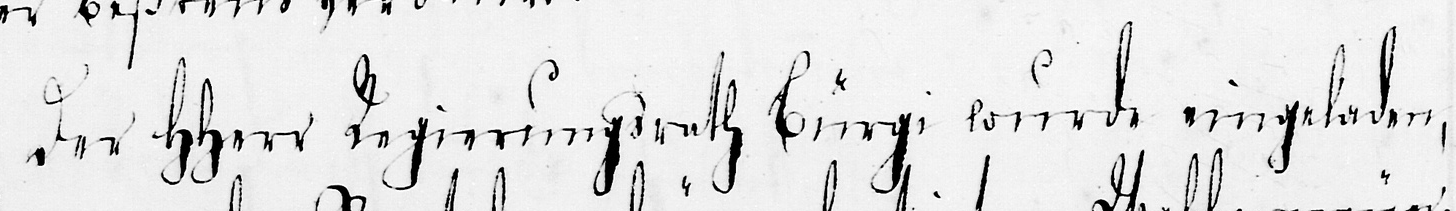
Der HHerr Regierungsrath Bürgi wurde eingeladen,
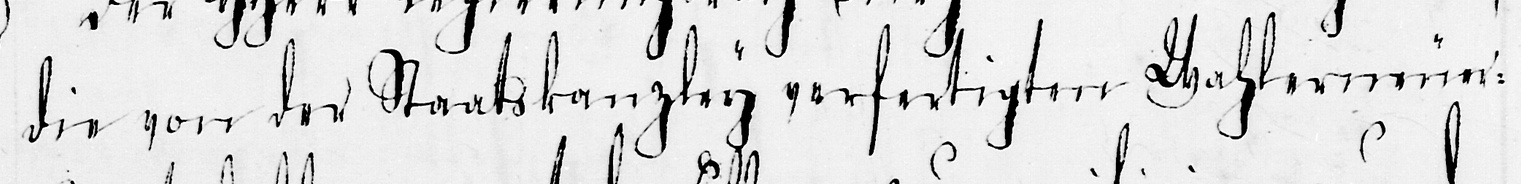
die von der Staatskanzley verfertigten Wahlerneuer¬
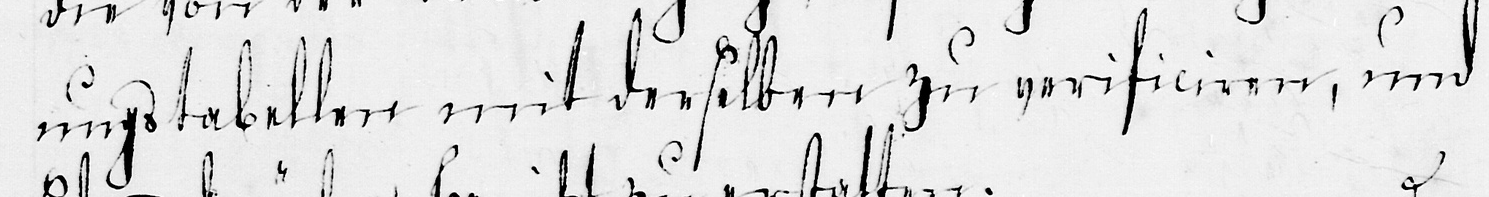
ungstabellen mit derselben zu verificiren, und
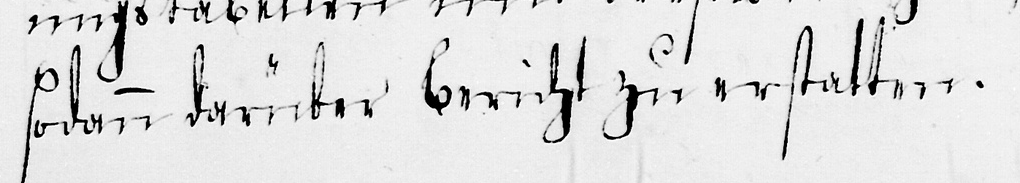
sodann darüber Bericht zu erstatten.
